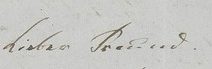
Lieber Freund.
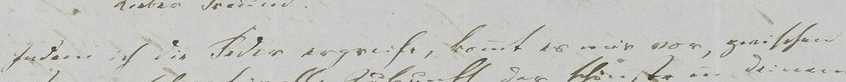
Indem ich die Feder ergreife, kommt es mir vor, zwischen
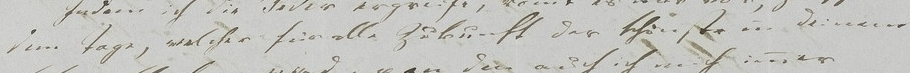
dem Tage, welcher für alle Zukunft der schönste in deinem
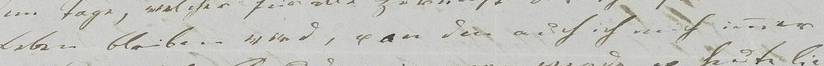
Leben bleiben wird, & an den auch ich mich immer
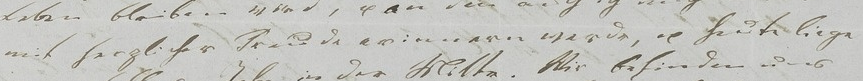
mit herzlicher Freude erinnern werde, & heute liege
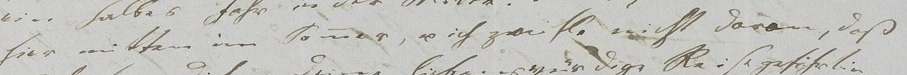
hier mitten im Sommer, & ich zweifle nicht daran, daß
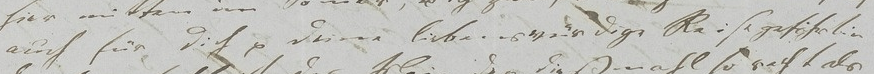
auch für dich & deine liebenswürdige Reisegefährtin
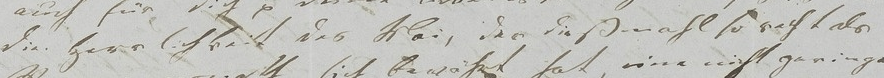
die Herrlichkeit des Mai, der dießmahl so recht als
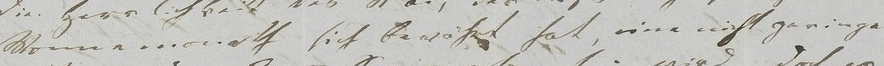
Wonnemonath sich bewährt hat, eine nicht geringe
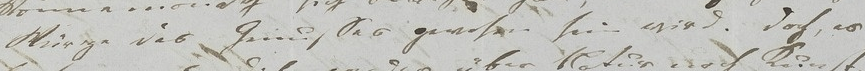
Würze des Genußes gewesen sein wird. Doch, es
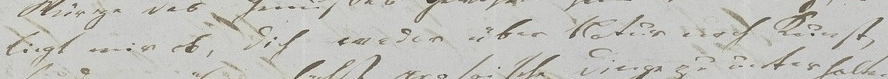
liegt mir ob, dich weder über Natur noch Kunst,
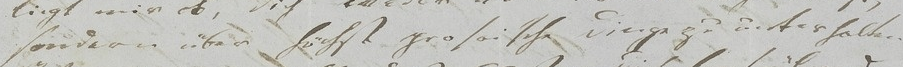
sondern über höchst prosaische Dinge zu unterhalten.
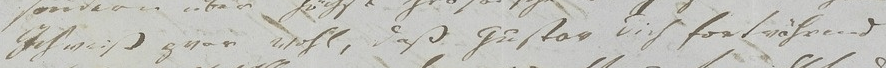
Ich weiß zwar wohl, daß Gustav dich fortwährend
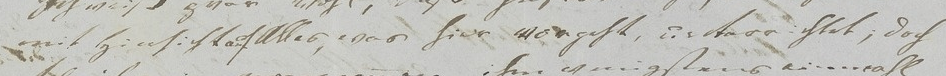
mit Hinsicht auf Alles, was hier vorgeht, unterrichtet; doch
